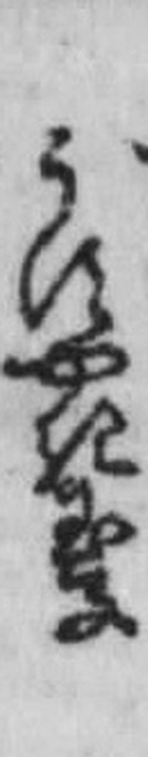うすやき玉子
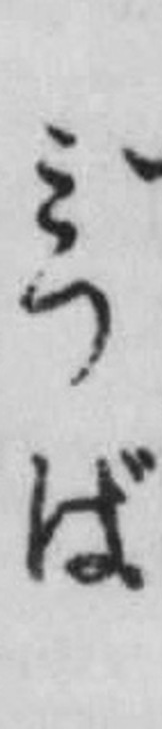みつば
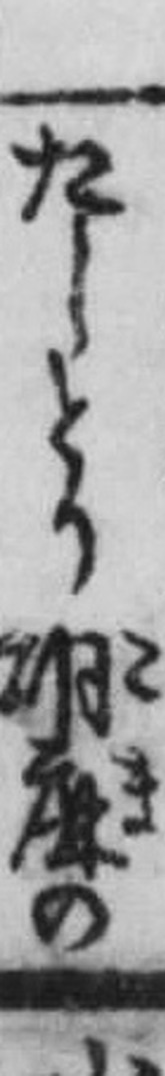ひたしとり胡麻の
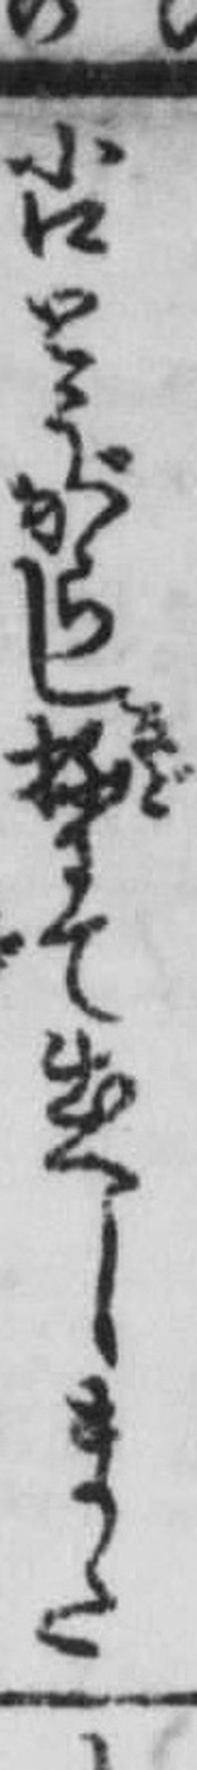小口とうがらし抔にて出へしまた
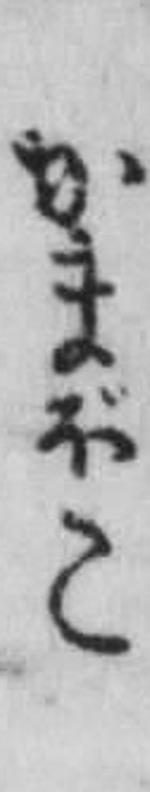かまぼこ
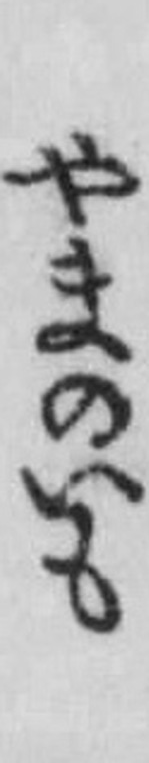やまのいも
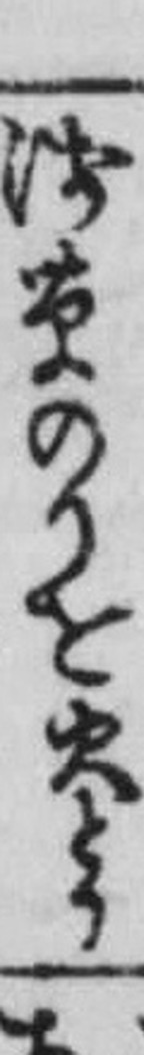浅草のりを火とり
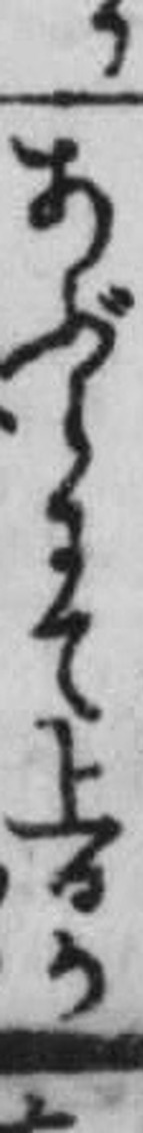あぶらにて上るか
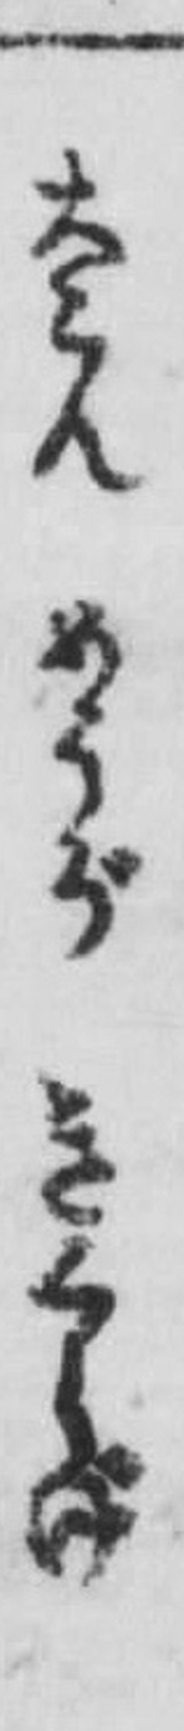大こんめうがきくらげ
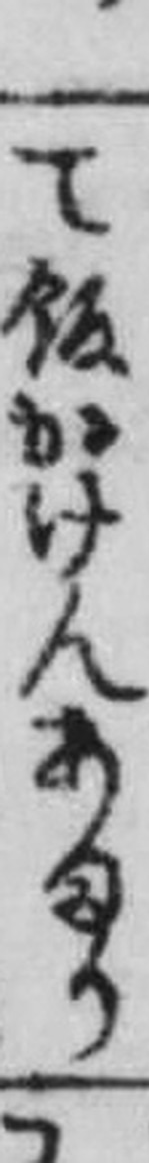て飯かけんあまり
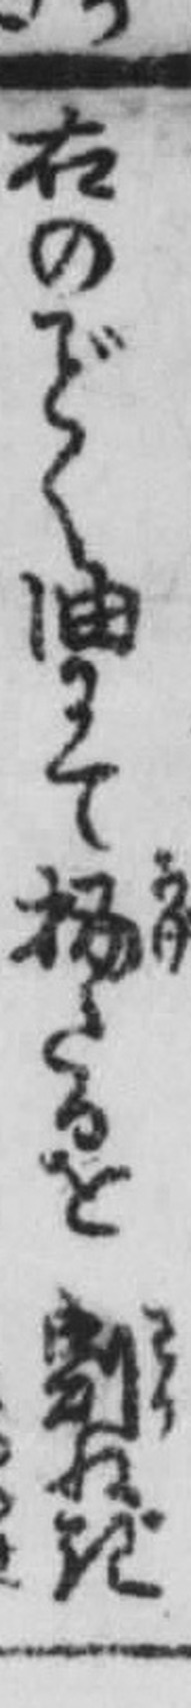右のごとく油にて揚たるを割ぬき
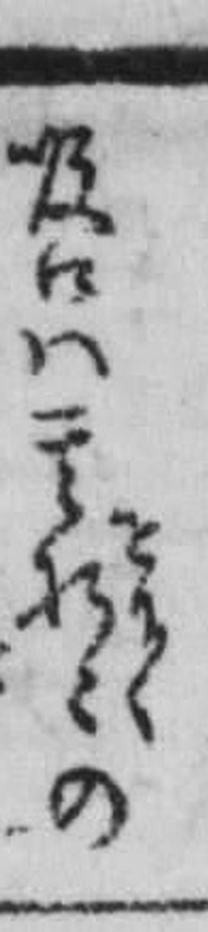吸口は其折々の
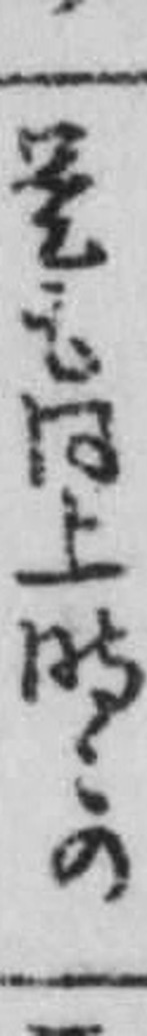是も同上時々の
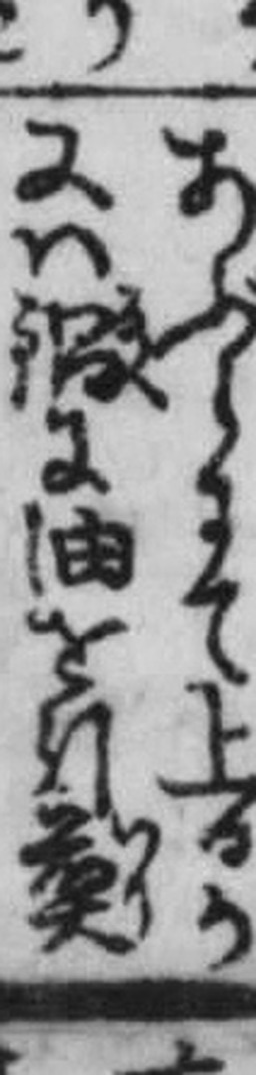又は鍋に油を引煮
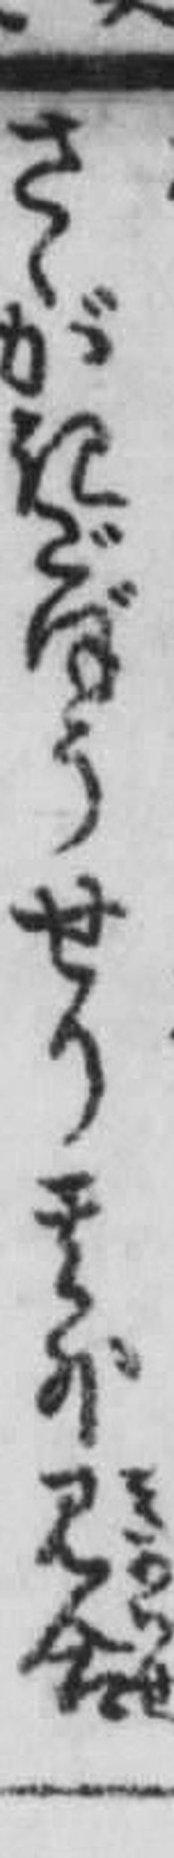さゝがきごぼうせり其外見合
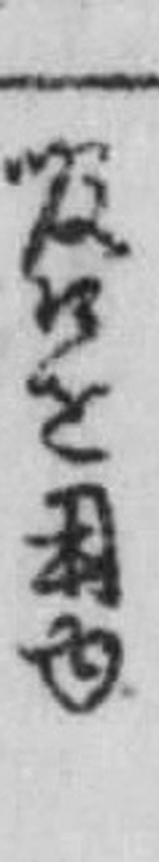吸口を用ゆ
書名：精進魚類間合料理/早速庖丁
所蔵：大阪府立大学学術情報センター 国文学研究資料館
